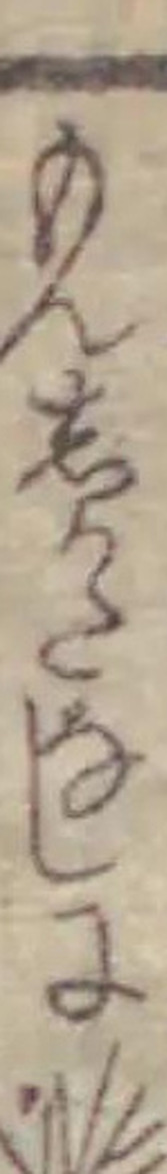もんしかたなしに
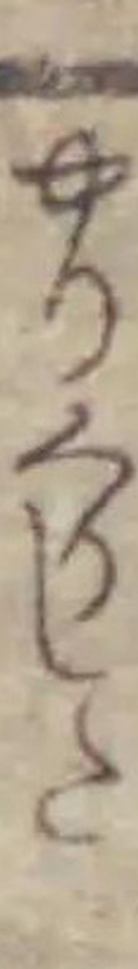やりくりした
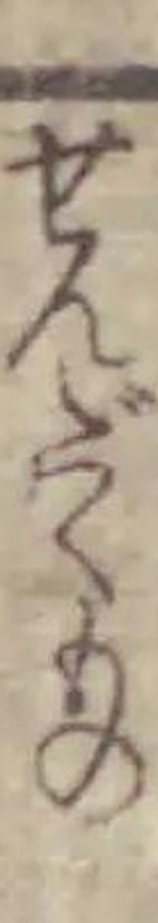せんだくもの
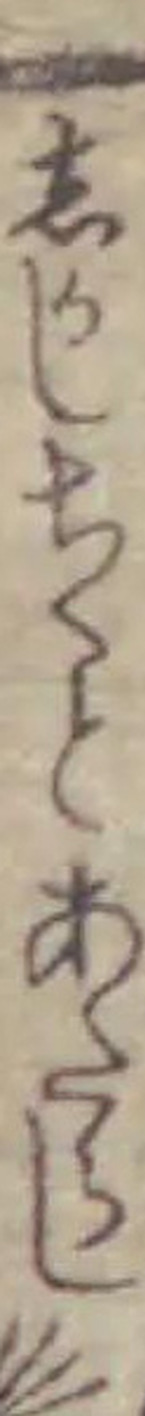しかしちくとあたらし
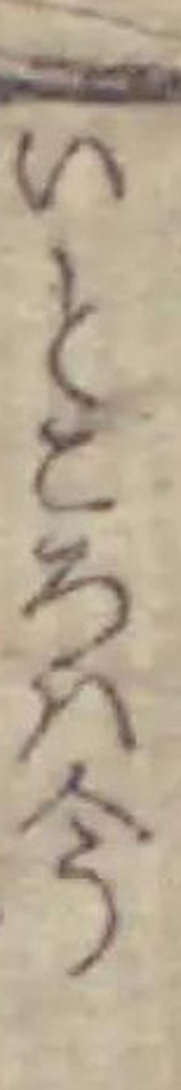いところは今
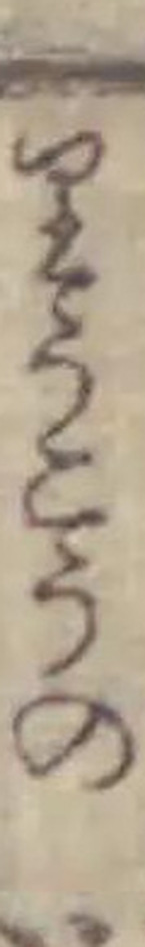りうこうの
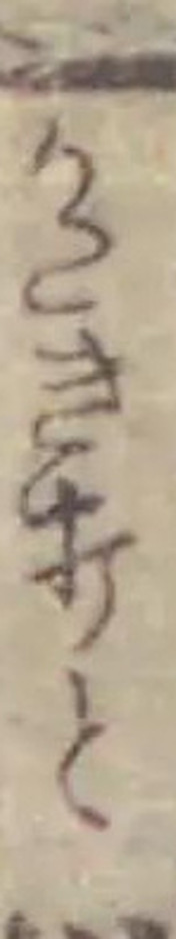かたき打と
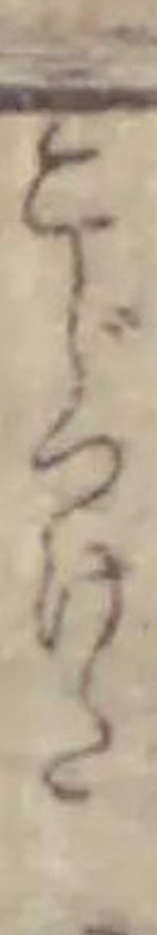こじつけた
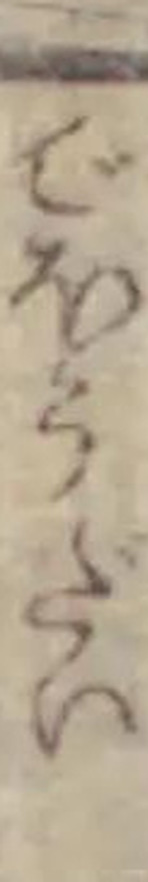ごほうだい
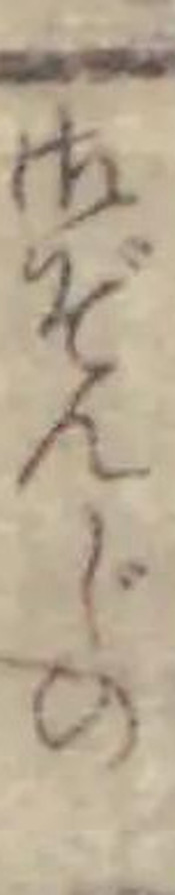御ぞんじの
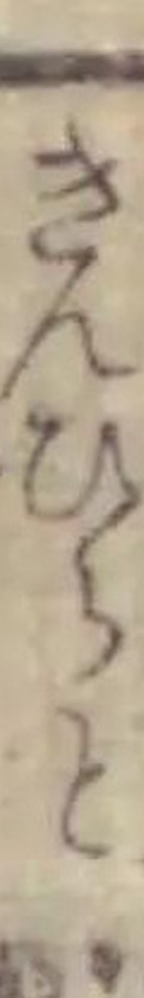きんひらと
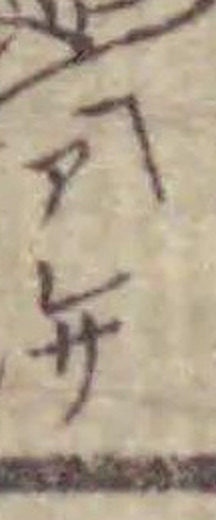〽アレサ
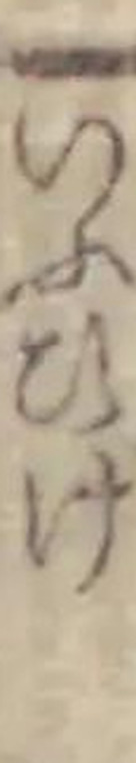いふひげ
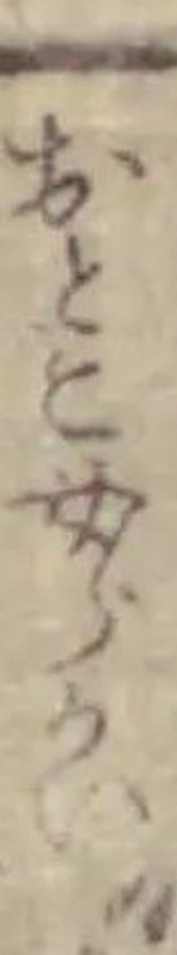おとこ女郎かい
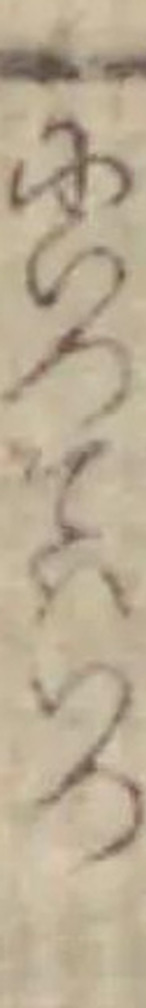にいつてはいつ
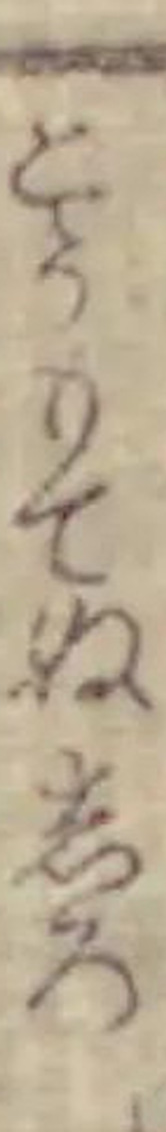とうもてぬしろ
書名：化物敵討 2巻
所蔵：国立国会図書館 National Diet Library, JAPAN
